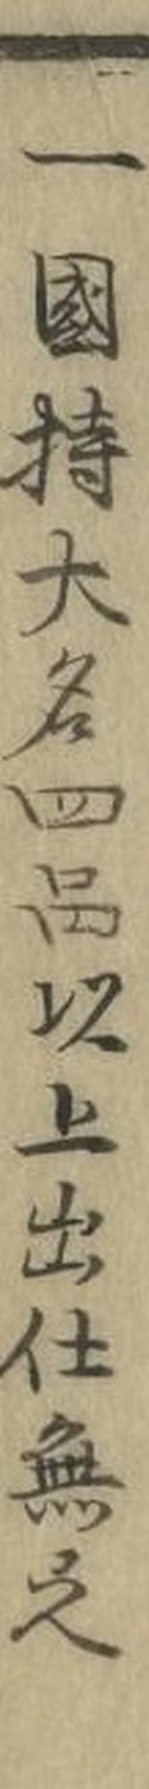一国持大名四品以上出仕無之
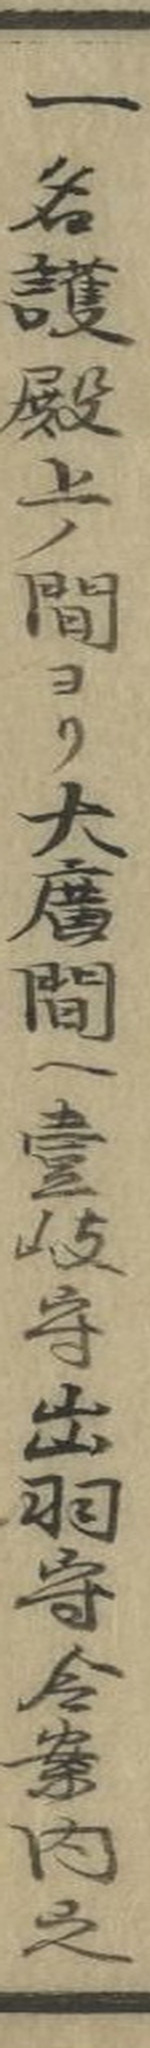一名護殿上ノ間ヨリ大広間へ壱岐守出羽守令案内之
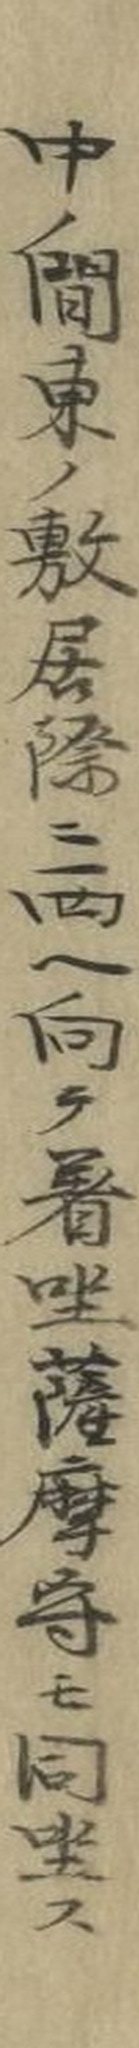中ノ間東ノ敷居際ニ西へ向テ着座薩摩守モ同坐ス
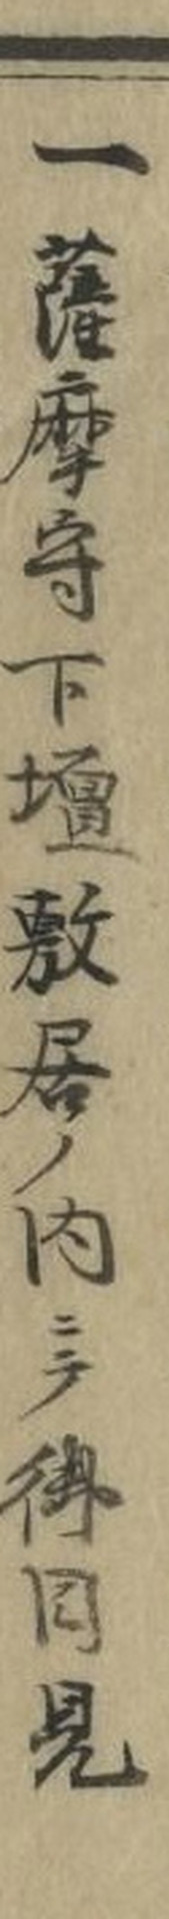一薩摩守下壇敷居ノ内ニテ御目見
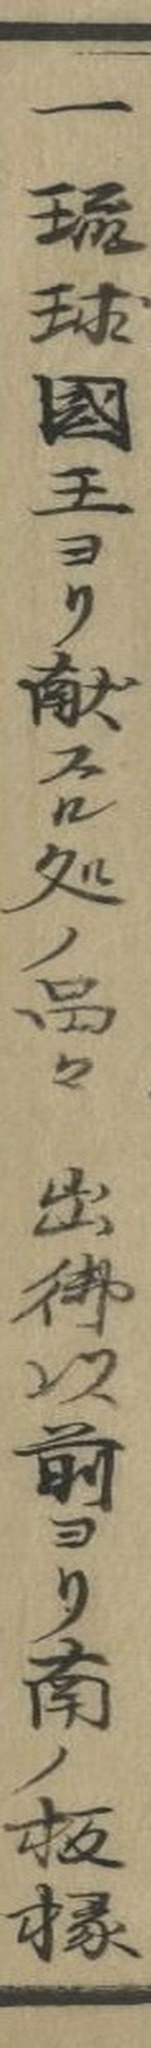一琉球国王ヨリ献スル処ノ品々出御以前ヨリ南ノ板縁

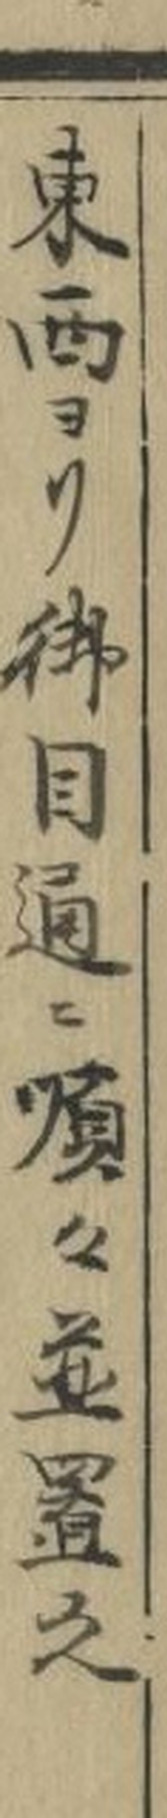東南ヨリ御目通ニ順々並置之
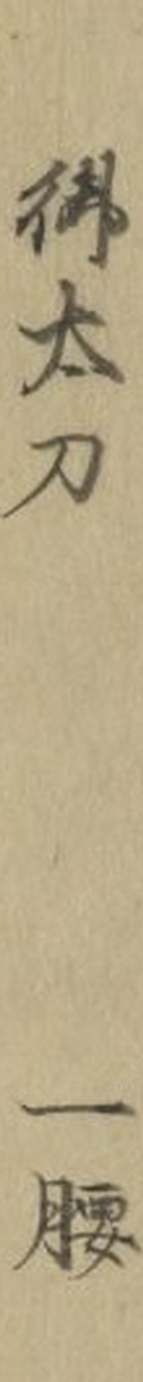御太刀一腰
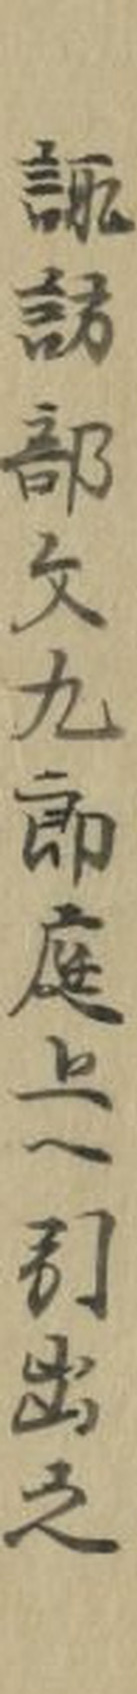諏訪部文九郎庭上へ引出之
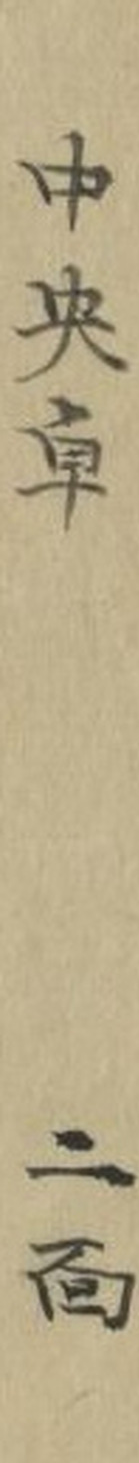中央卓二面
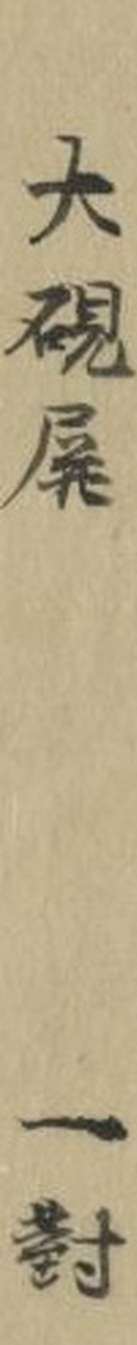大硯屛一対
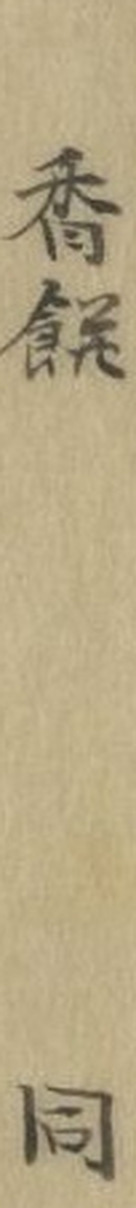香餅同
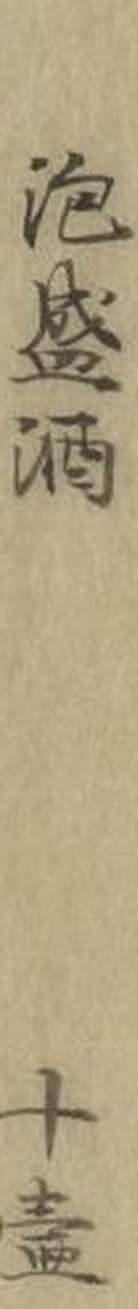泡盛酒十壺
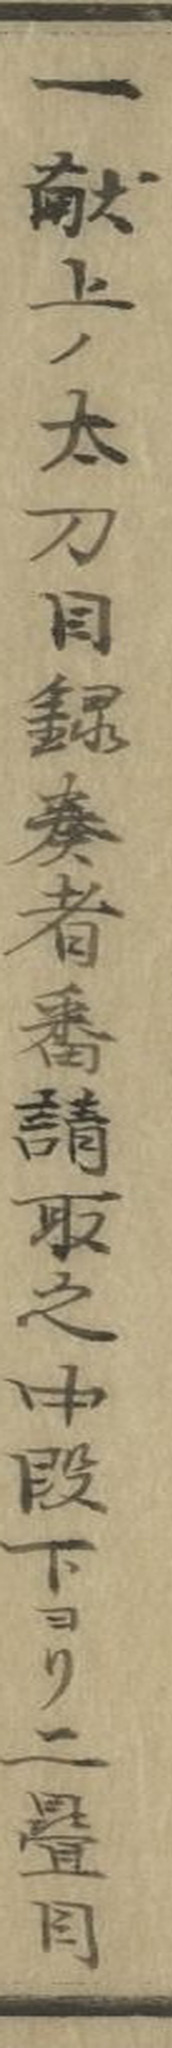一献上ノ太刀目録奏者番請取之中段下ヨリに二畳目
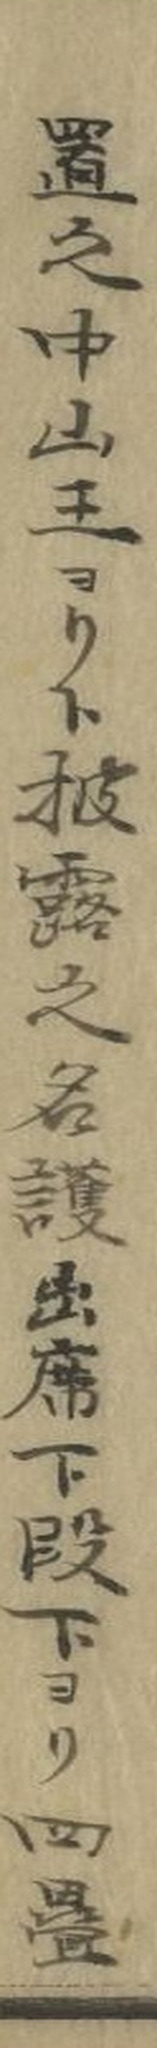置之中山王ヨリト披露之名護出席下段ヨリ四畳
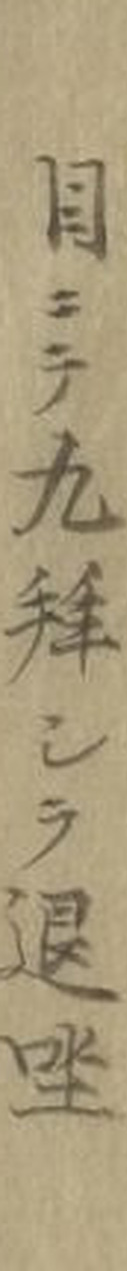目ニテ九拝シテ退坐
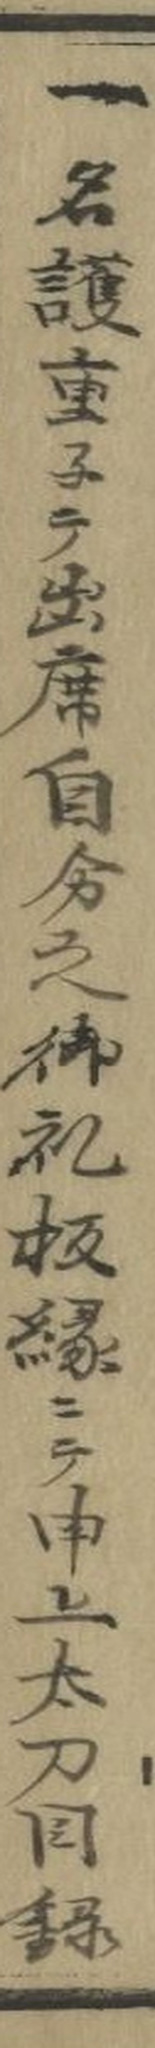一名護重ネテ出席自分之御礼板縁ニテ申上太刀目録
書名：琉球往来（下）
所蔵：University of the Ryukyus Library
